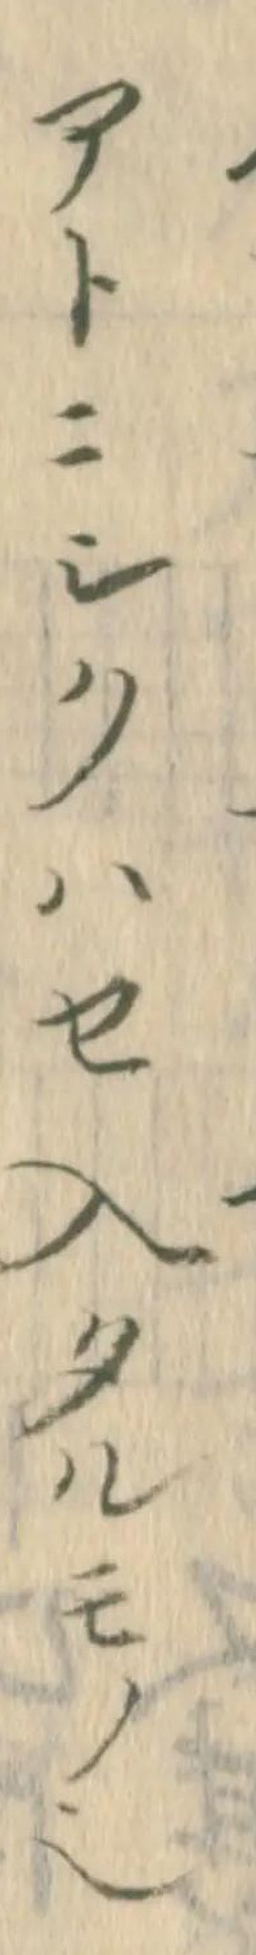アトニシクハセ入タルモノ也
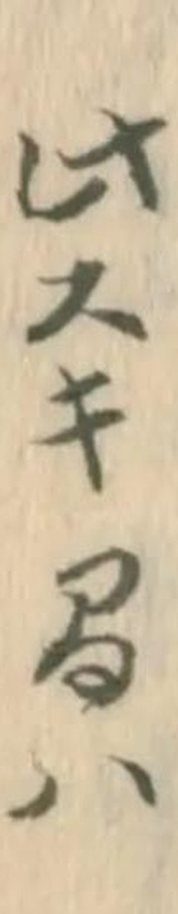此スキ間ハ
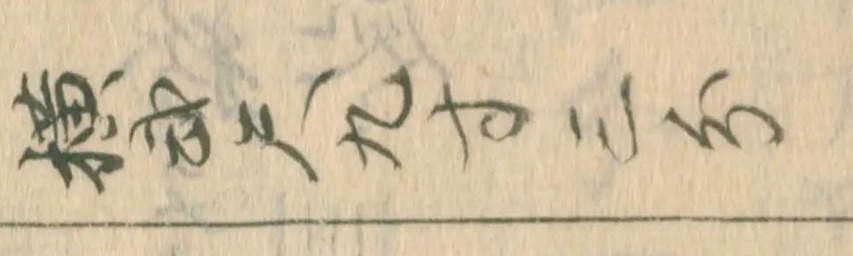横弐尺九寸三分
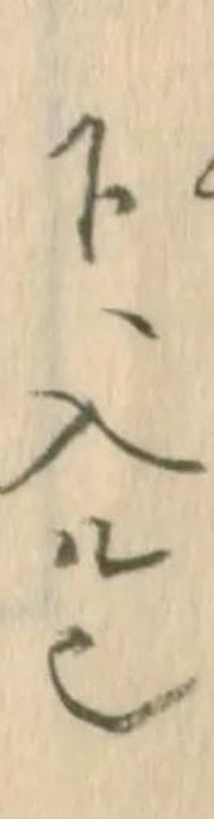下ヘ入ル也
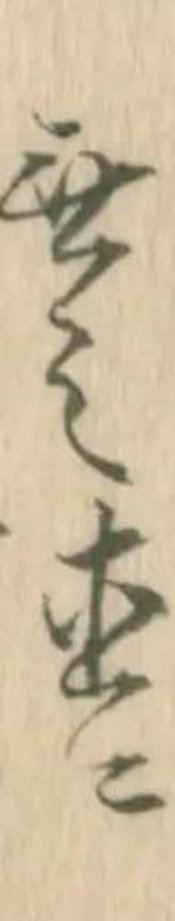無之直ニ

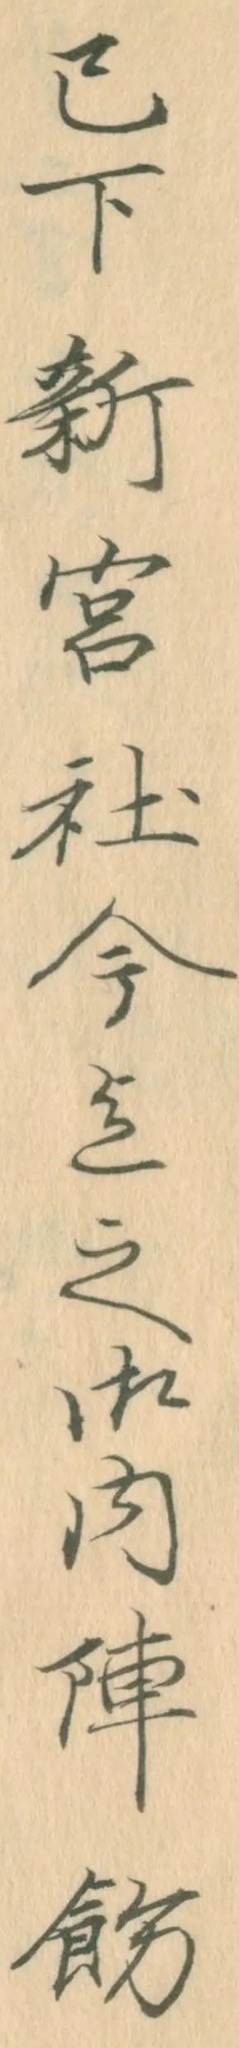已下新宮社今迄之御内陣錺
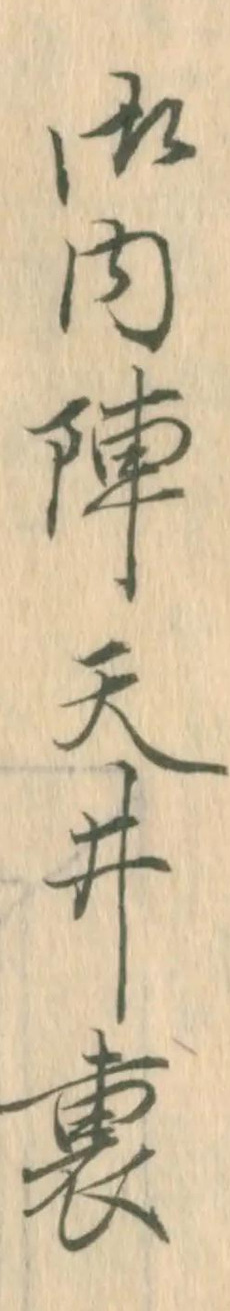御内陣天井裏
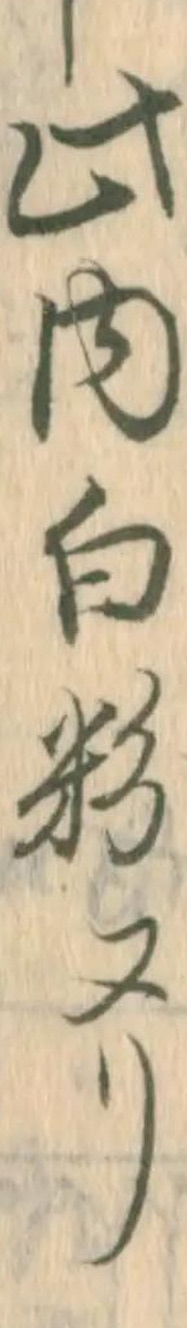此内白粉ヌリ
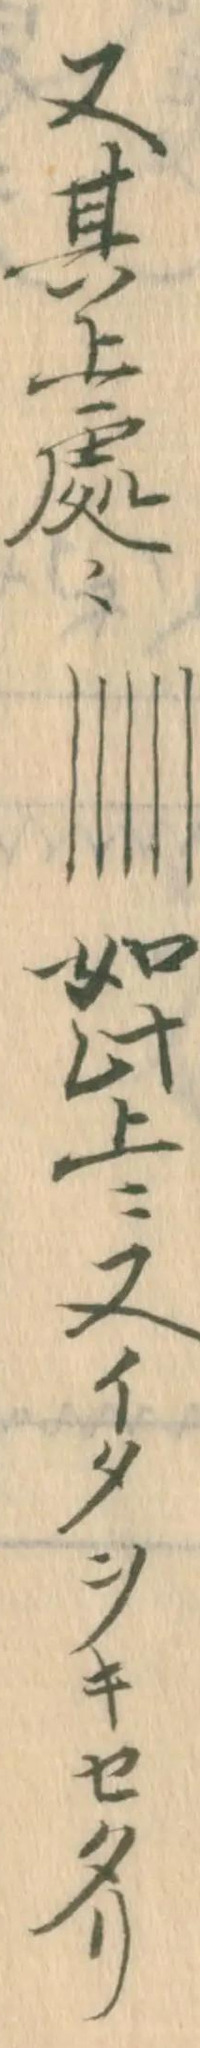又其上処々如此上ニ又イタヲキセタリ
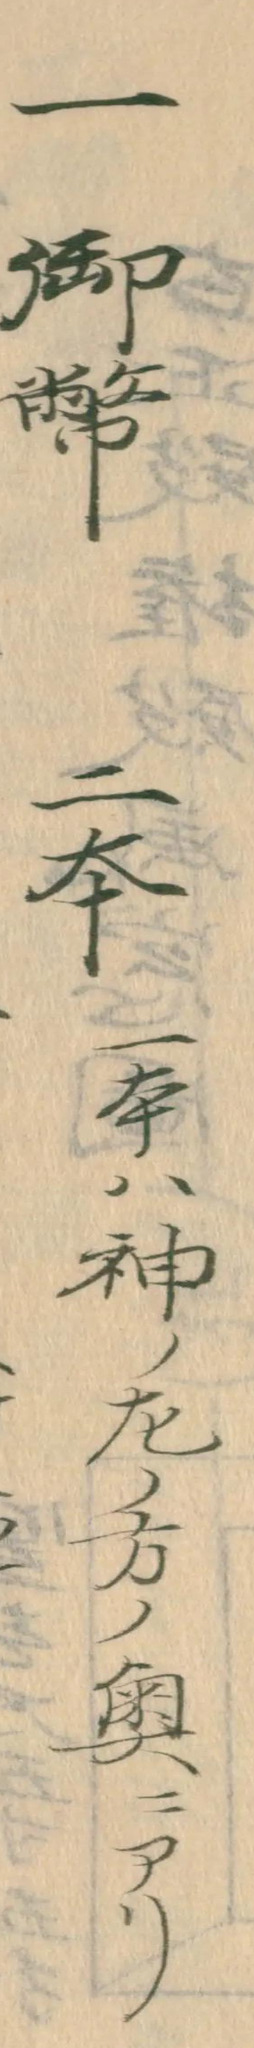一御幣二本一本ハ神ノ左ノ方ノ奥ニアリ
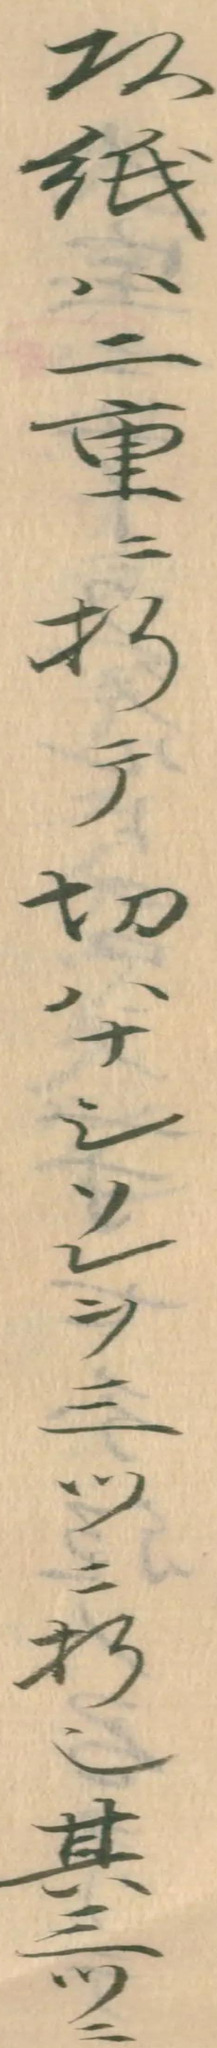頭紙ハ二重ニ折テ切ハナシソレヲ三ツニ折也其三ツニ
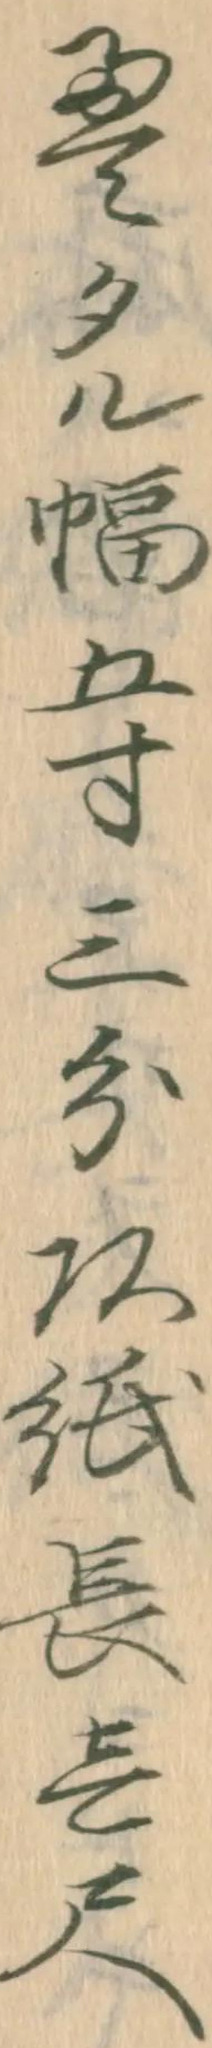畳タル幅五寸三分頭紙長壱尺
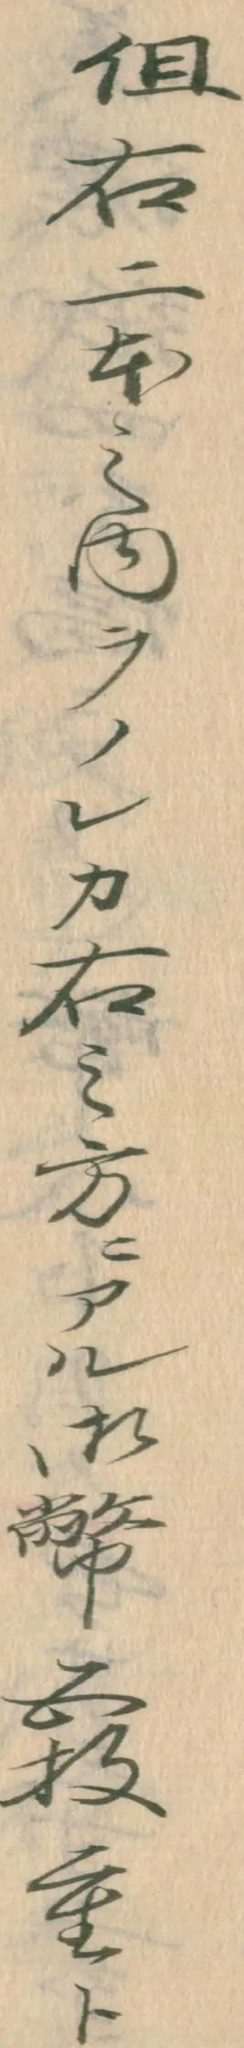但右二本之内ヲノレカ右之方ニアル御幣五枚重ト
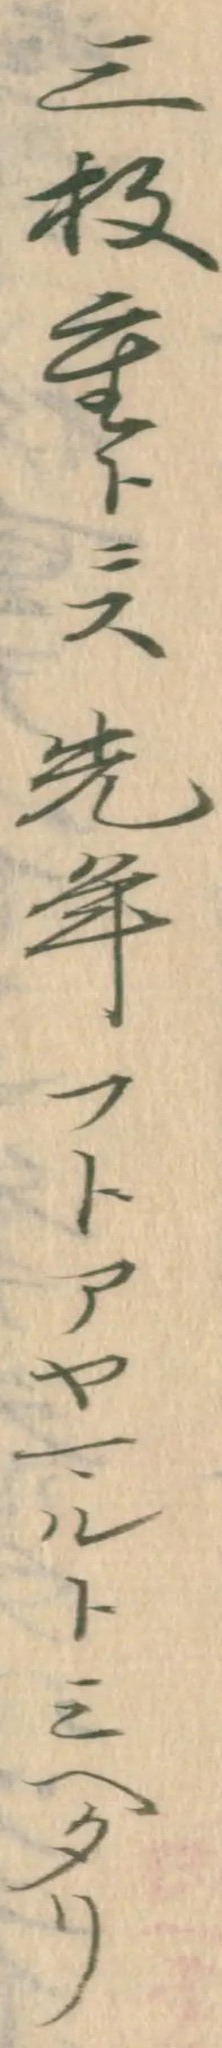三枚重トニス先年フトアヤマルトミヘタリ
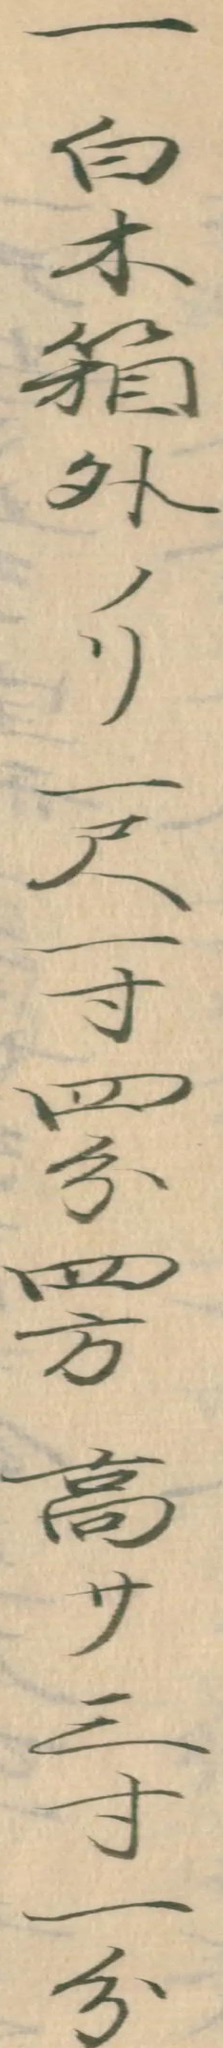一白木箱外ノリ一尺一寸四分四方高サ三寸一分
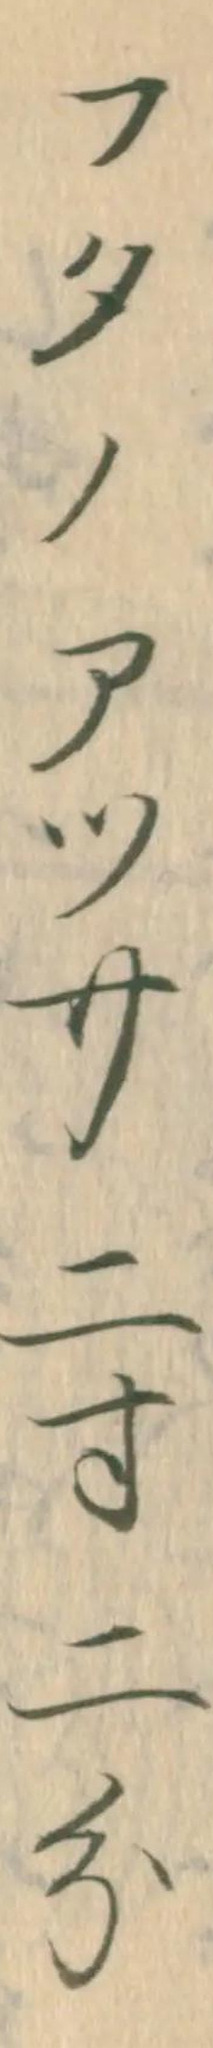フタノアツサ二寸二分
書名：賀茂社記録. 第15冊
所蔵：国立国会図書館 National Diet Library, JAPAN
